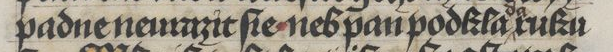padne neurazit ſie.neb pan podklada ruku
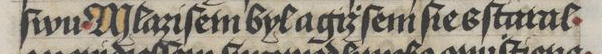ſwu.Mlaziſem byl a giŻ ſem ſie sſtaral.
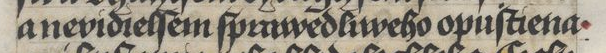a newidielſem ſprawedliweho opuẛtiena.
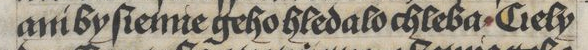ani by ſiemie geho hledalo chleba.Ciely
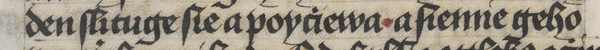den ſlituge ſie a poyċíewa.a ſiemie geho
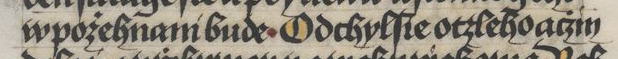w pożehnaní bude.Odchylſie otzleho acżin
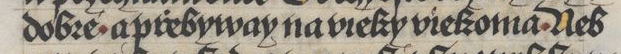dobré.a pṙebyway na vieky viekoma.Neb
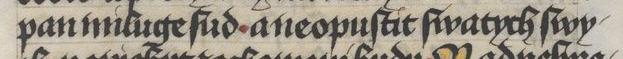pan miluge ſud.a neopuſtit ſwatych ſwy¬
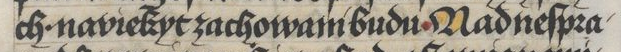ch.nawiekyt zachowaní budu.Nad neſpra¬
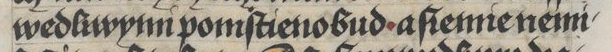wedliwymi pomẛtieno bud.a ſiemie nemí¬
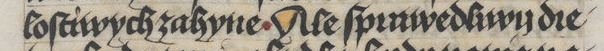loſtiwych zahyne.Ale ſprawedliwy die¬
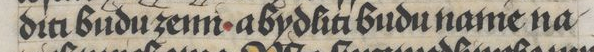diti budu zemi.abydliti budu naníe na¬
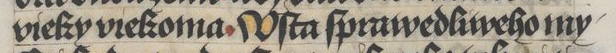vieky viekoma.Vſta ſprawedliweho my¬
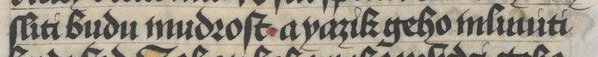ſliti budu mudfoſt.a yazik geho mluuiti¬
